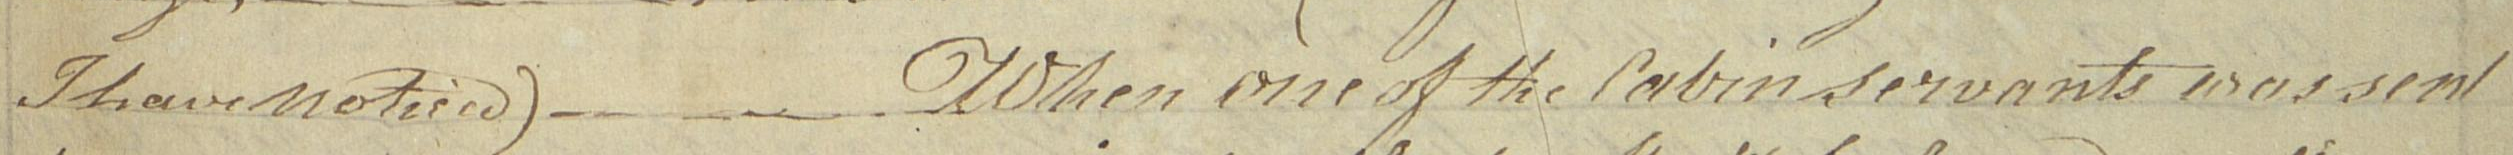I have noticed) When one of the Cabin servants was sent
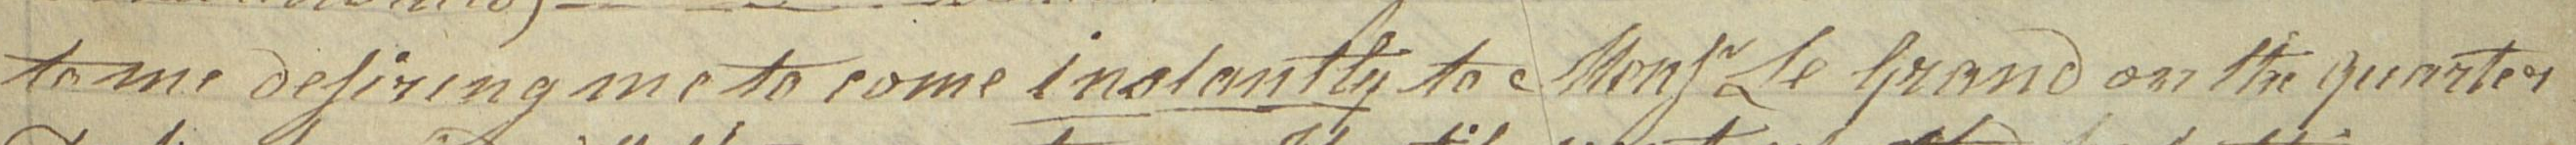to me desiring me to come instantly to Mons^r. Le Grand on the quarter
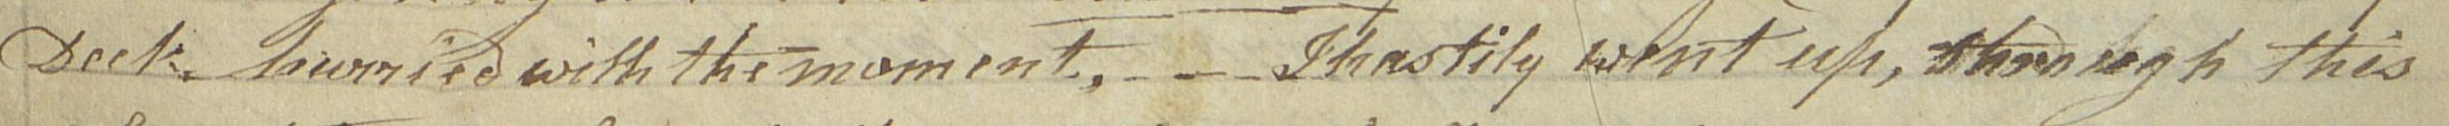Deck, hurried with the moment, I hastily went up, though this
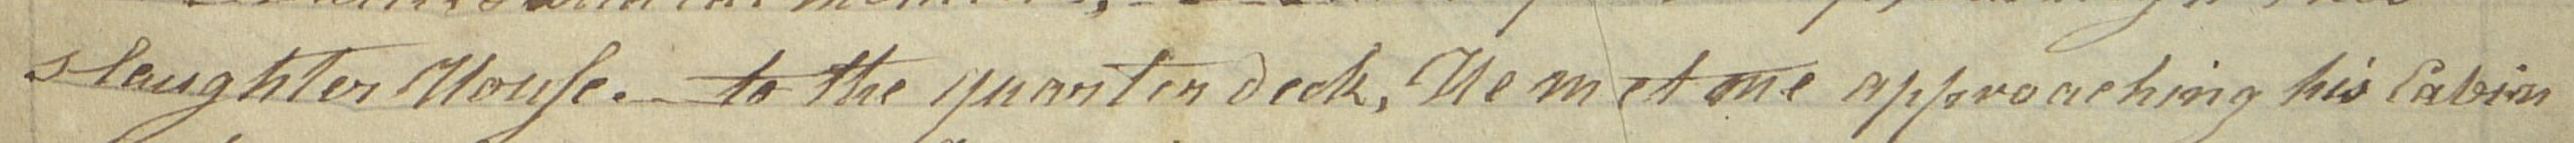slaughter House. to the quarter deck, He met one approaching his Cabin
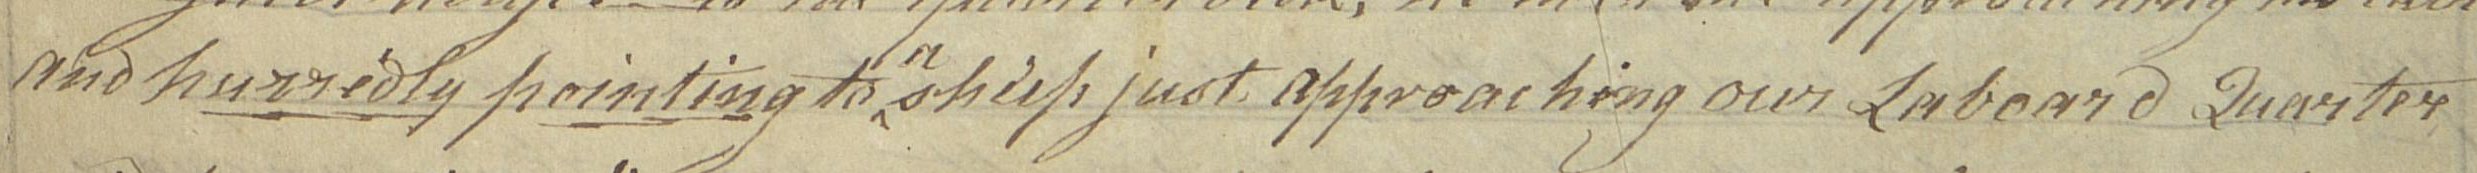and hurredly pointing to ^ ship just approaching our Laboard Quarter
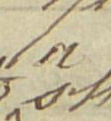a
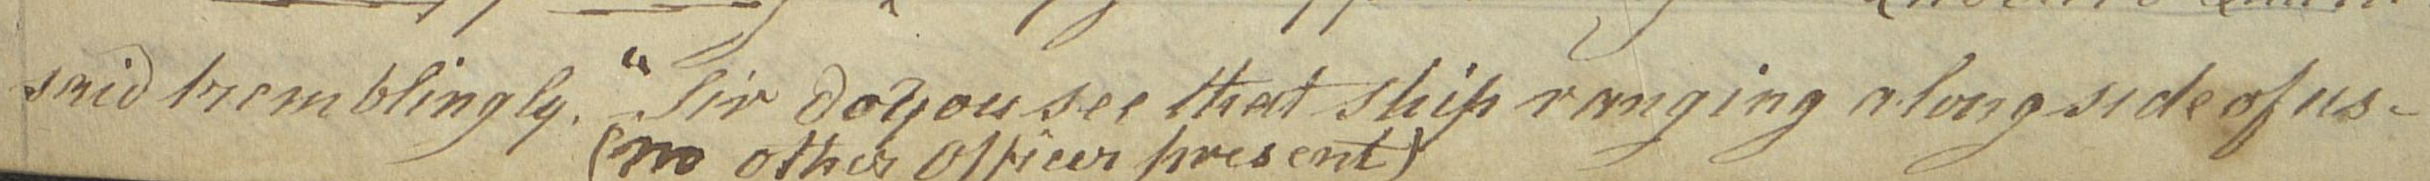said tremblingly "Sir do you see that ship ranging along side of us
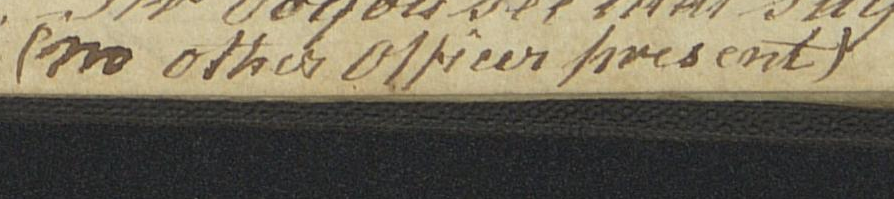(no other Officer present)
